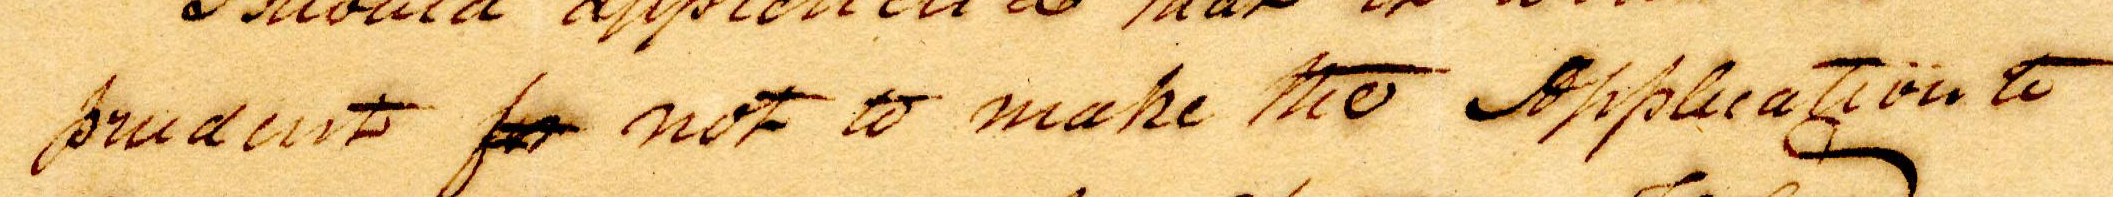prudent for not to make the Application to
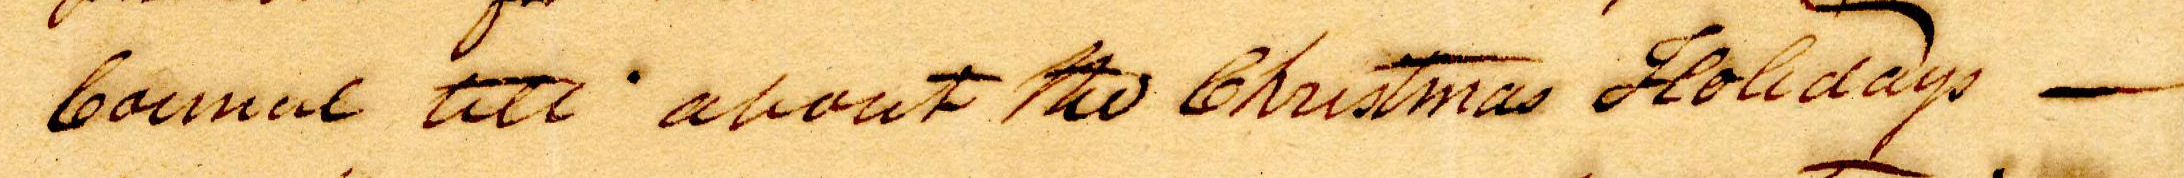Council till about the Christmas Holidays-
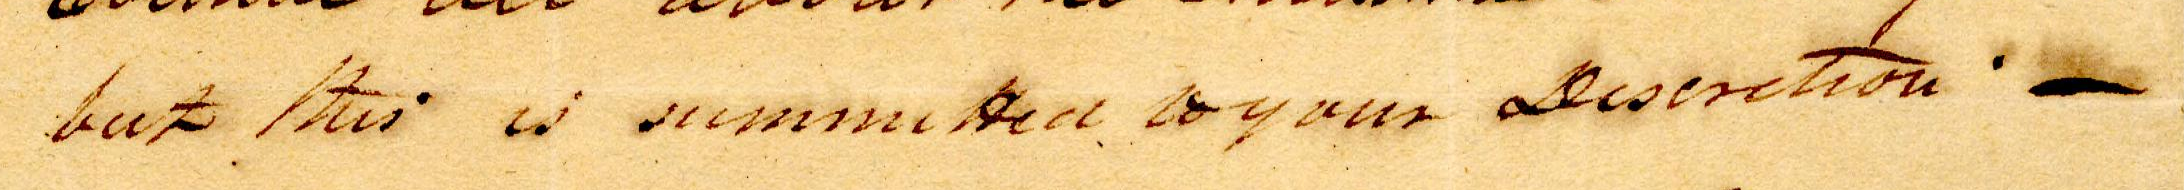but this is summitted to your Discretion-
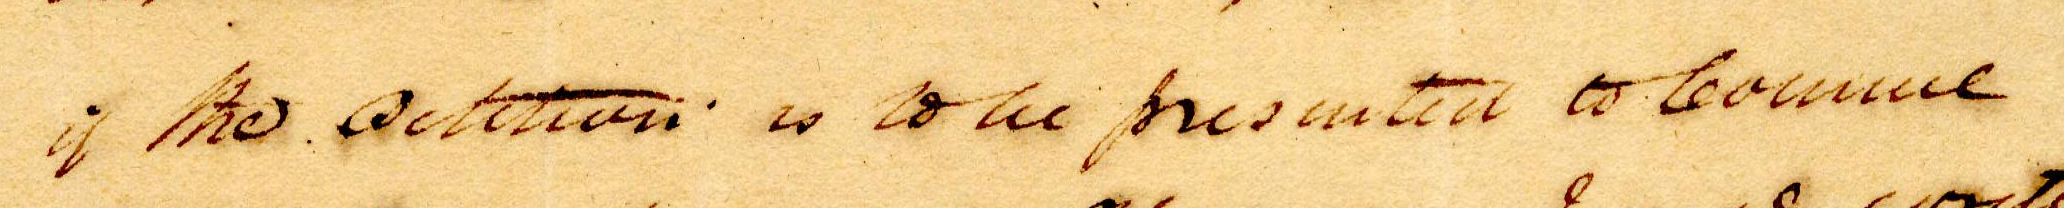if the Petition is to be presented to Council
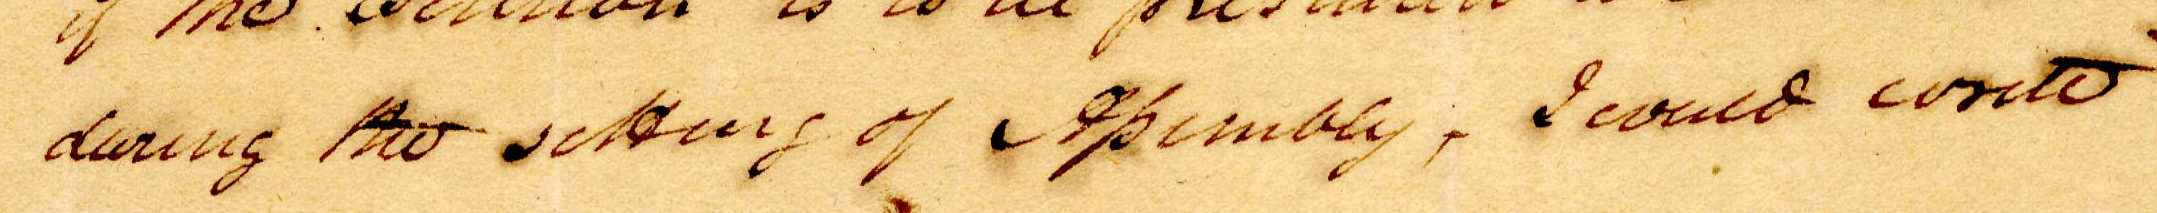during the sitting of Assembly, I could corate
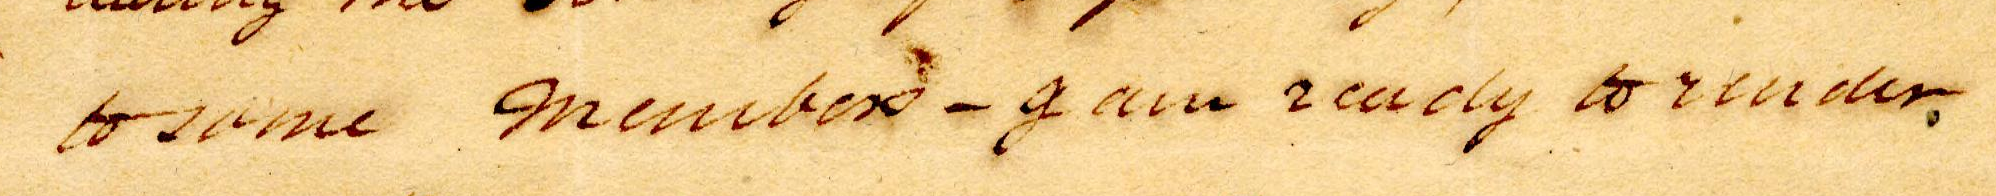to some Members. I am ready to render
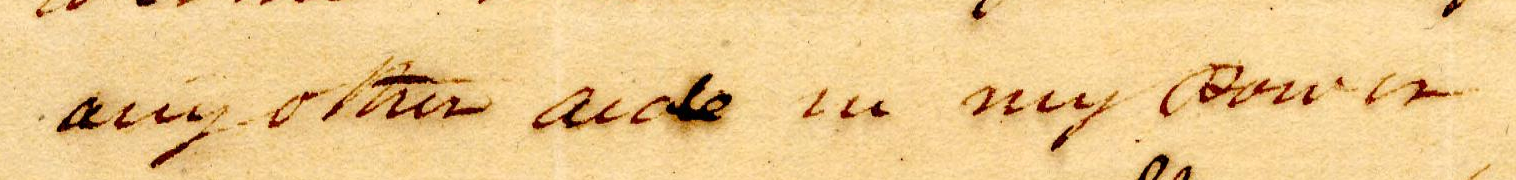any other aide in my Power
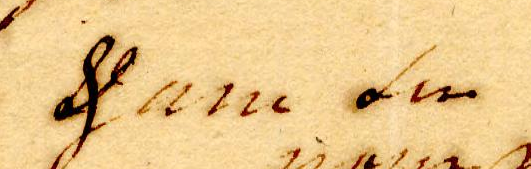& am Sir
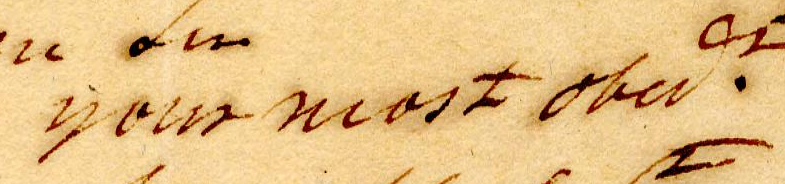your most obed^t.
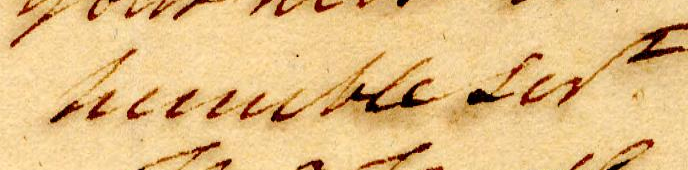humble Serv^t.
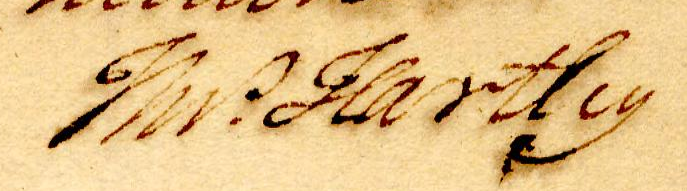Tho^s. Hartley
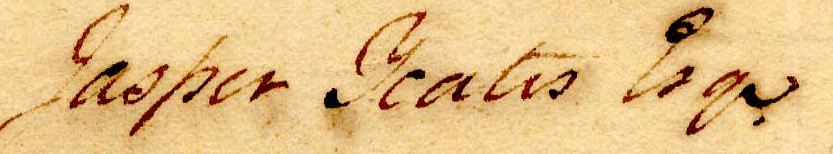Jasper Yeates Esq.
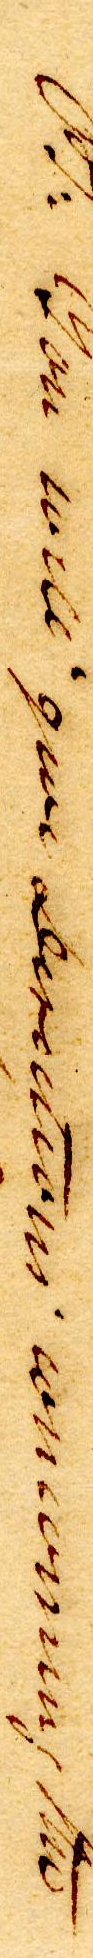PS. You will give Directions concerning the
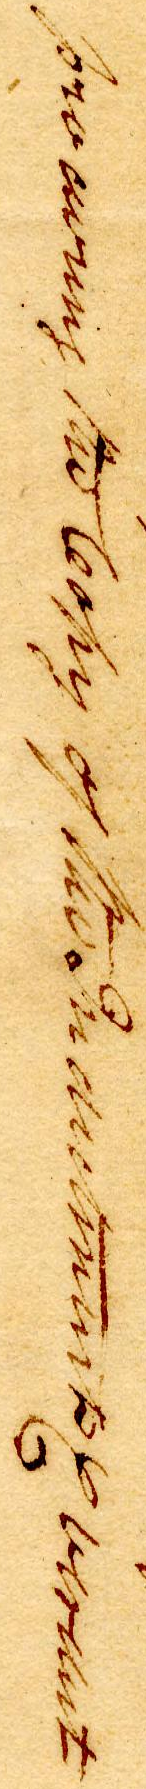procuring the Copy of the Indictment & verdict
